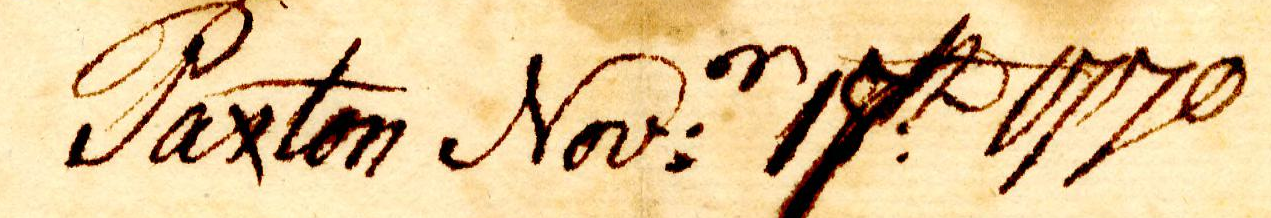Paxton Nov^r: 19^th: 1770
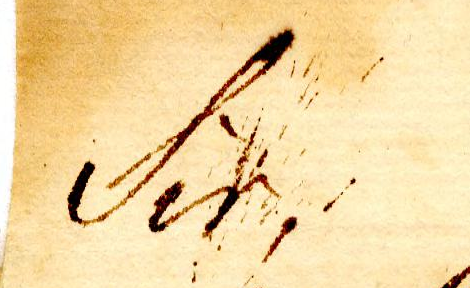Sir,
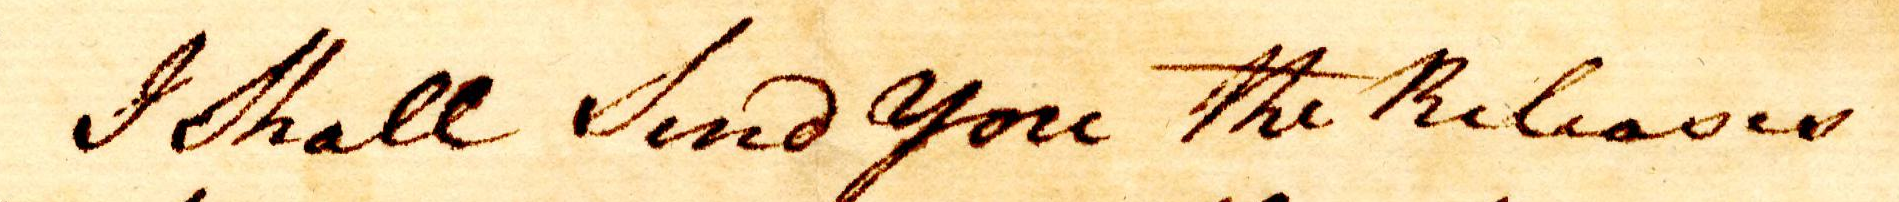I shall send you the Releases
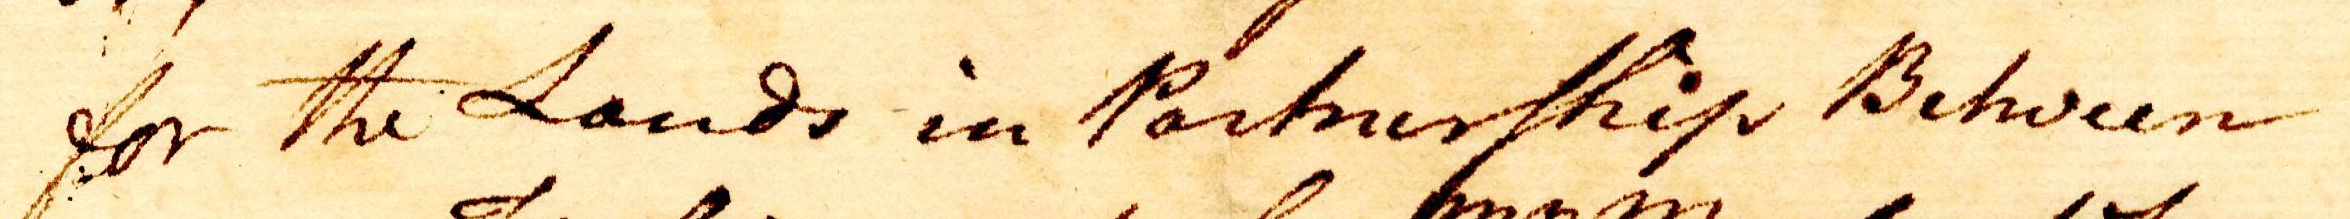for the Lands in Partnerships Between
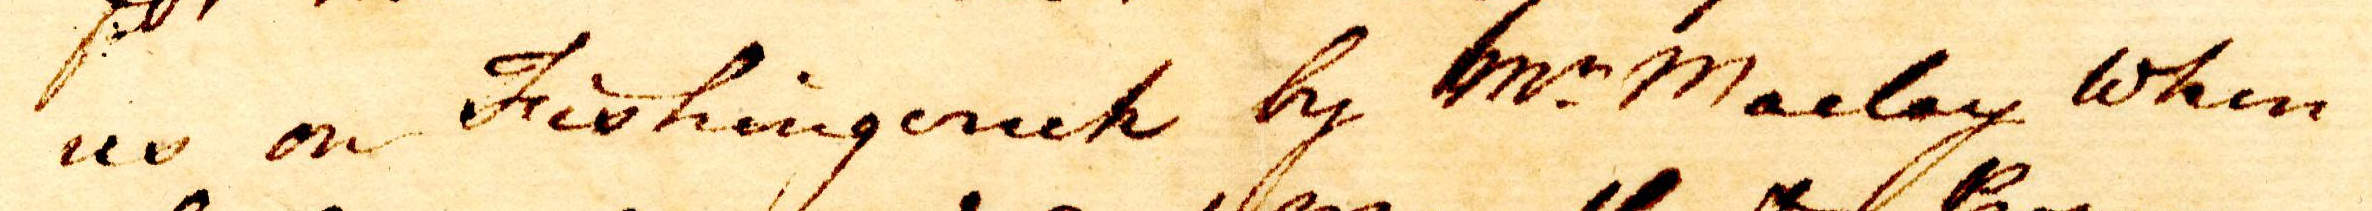us on Fishingcreek by M^r. Maclay when
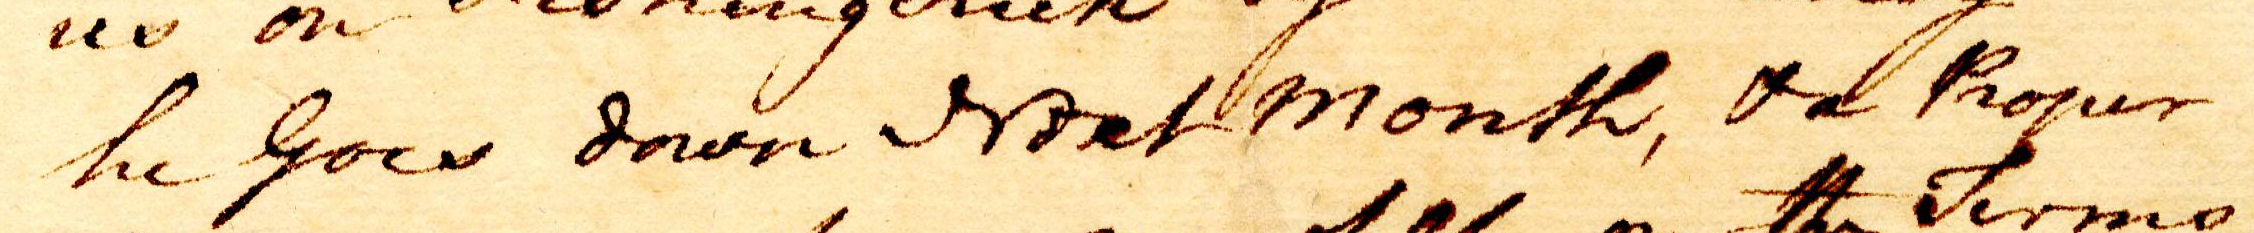he Goes down Next month, & a Proper
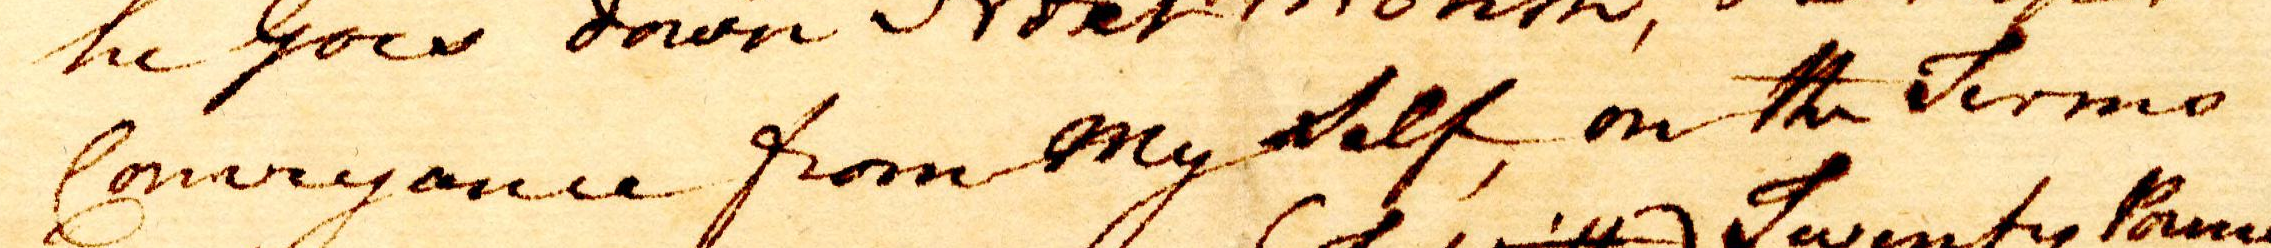Coveyance from my Self on the Terms
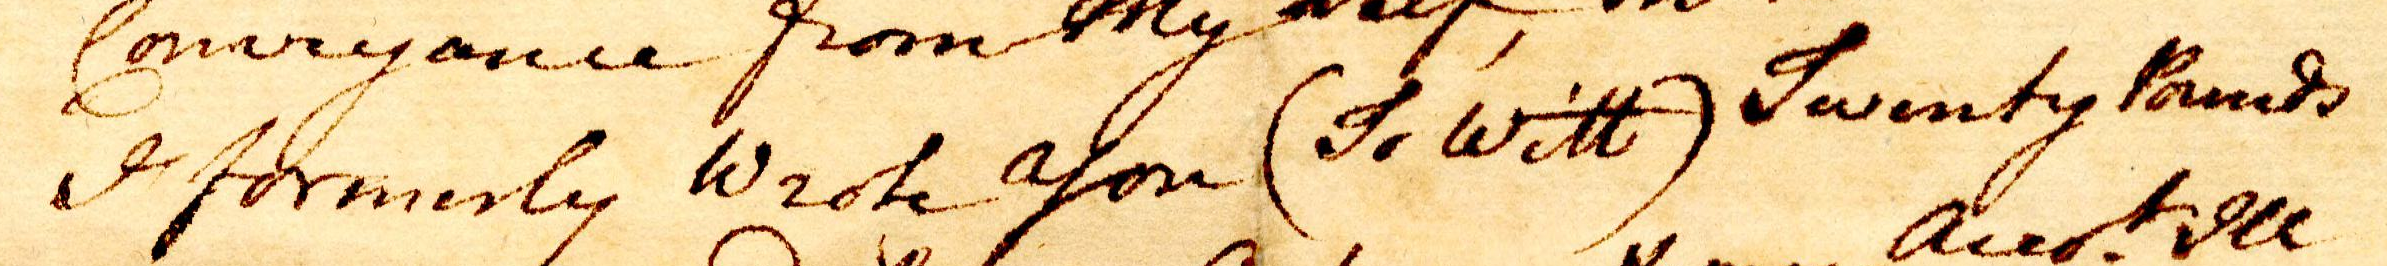I formerly Wrote you (To witt) Twenty Pounds
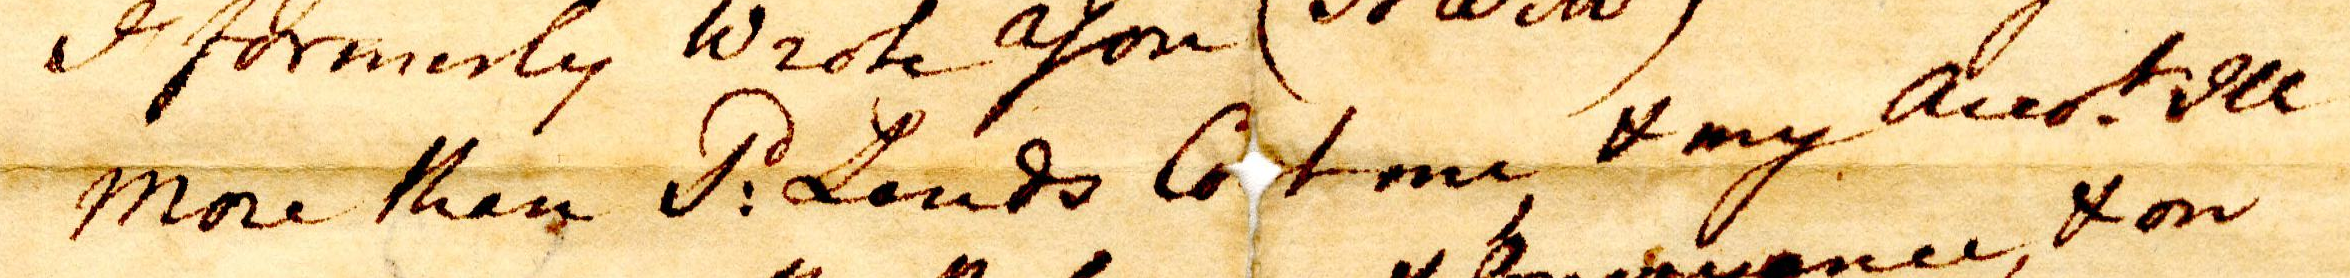more than s^d: Lands C[_]t me & my Acco^t. Ill
